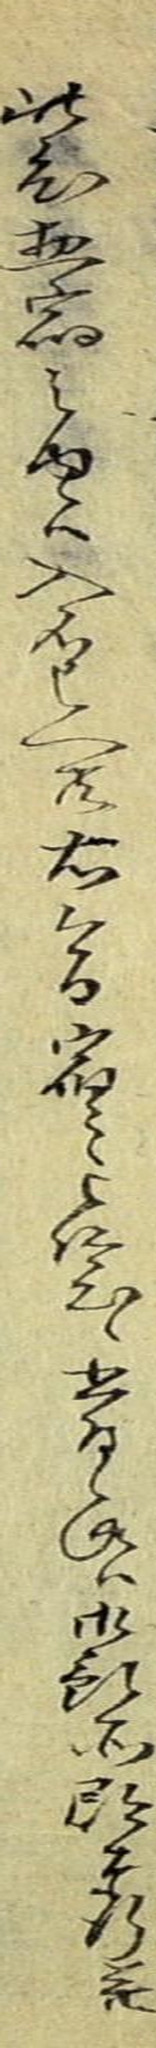此度惣宿之内へは入不申候へ共右今日宿々へ被仰出候書付之趣は御預所郡奉行并
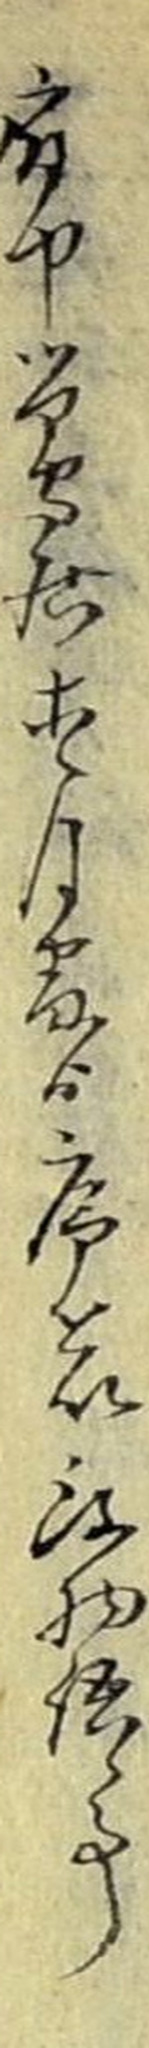府中留守居等へ月番ゟ序を以致物語候事
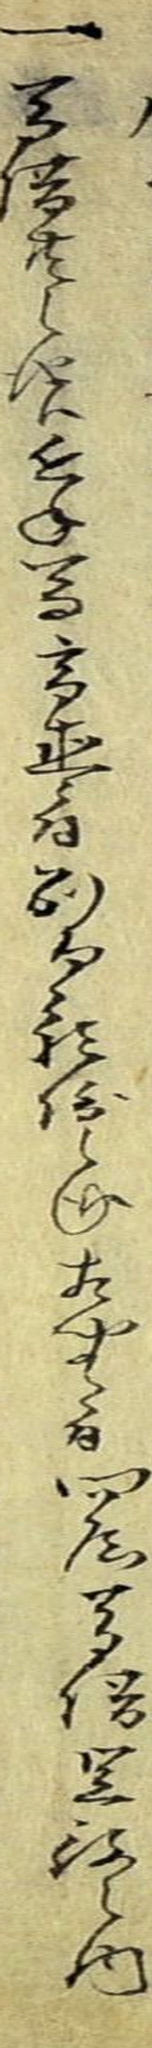一馬借共之儀は近年馬高直に付別而難儀之趣相聞候に付問屋馬借足役之内
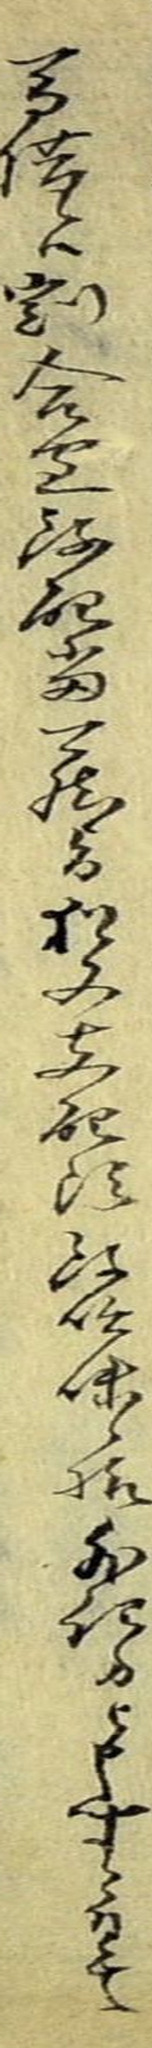馬借は割合宜致配当可然旨猶又支配頭致吟味候様外記方被申聞候に付其
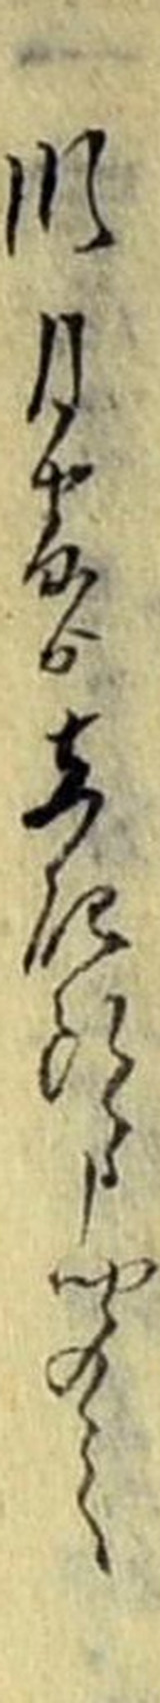段月番ゟ支配頭申聞之

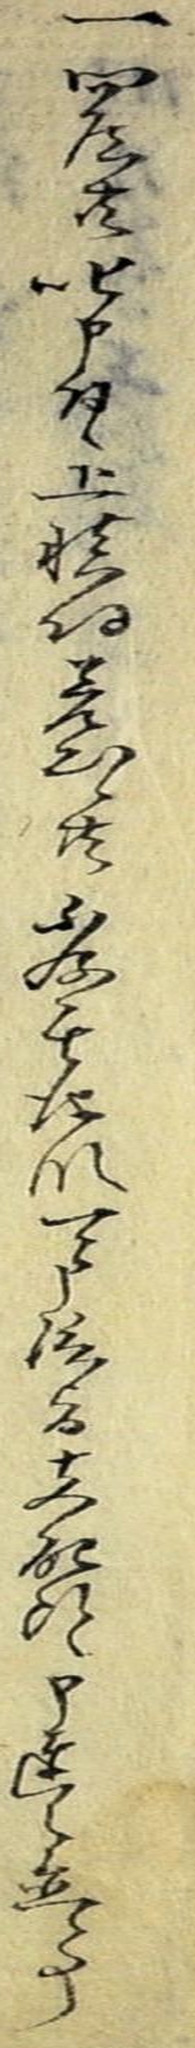一問屋共叱申付候上慎伺差出候共不及其儀段可申渡旨支配頭へ申達之置候事
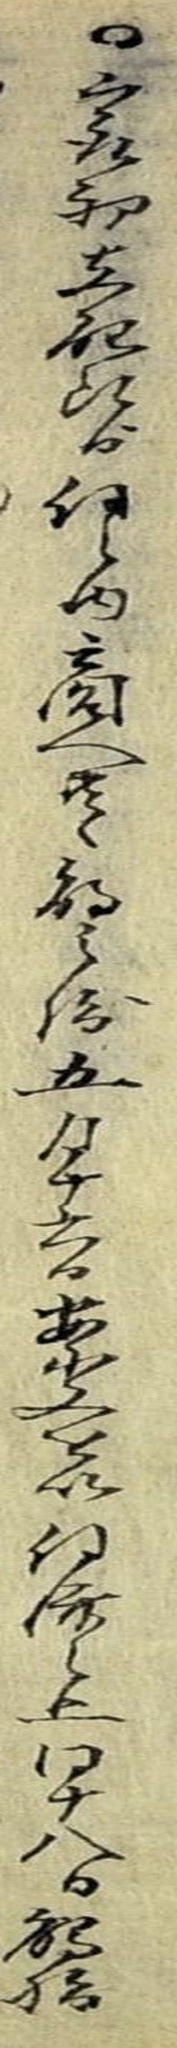○最初支配頭ゟ伺之内商人共へ触候儀五月十六日案文を以伺済之上同十八日触指
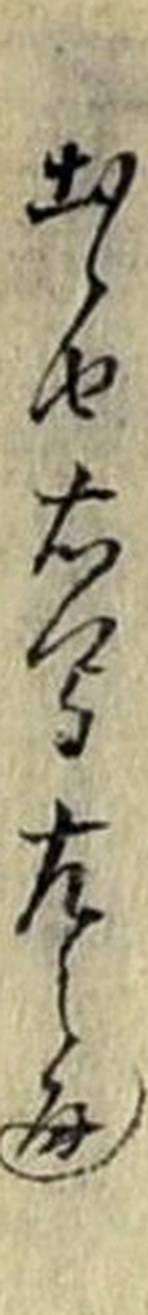出候由右写左之通
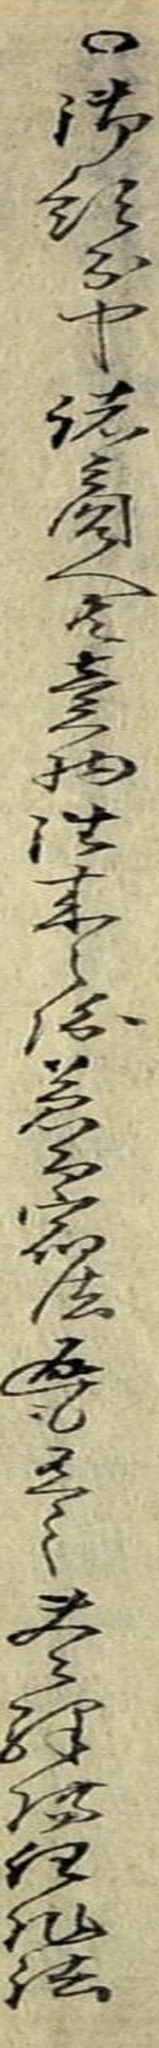○御領分中諸商人共売物往来之儀兼而宿法通も有之夫々駅場任作法
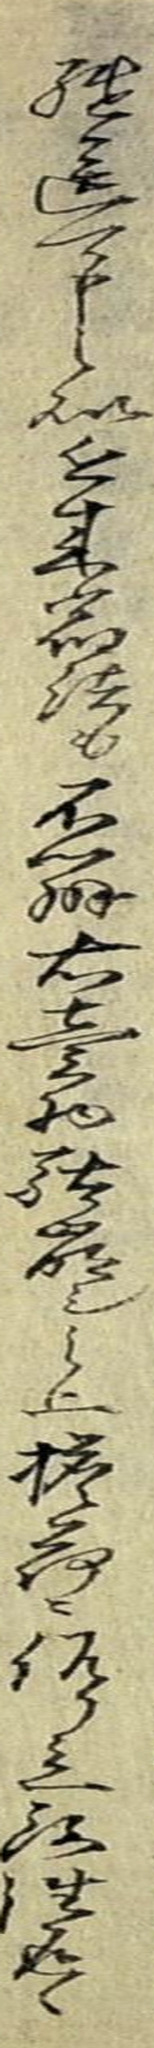継送可申候処近来宿法も不弁右売物駄崩し之上担荷に作り立致往返候
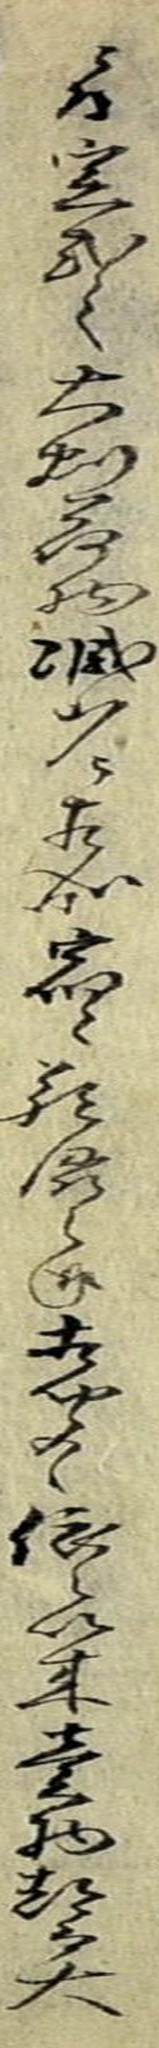に付定式之大判荷物減少に相成宿々難渋之趣相聞候依之以來売物都而大
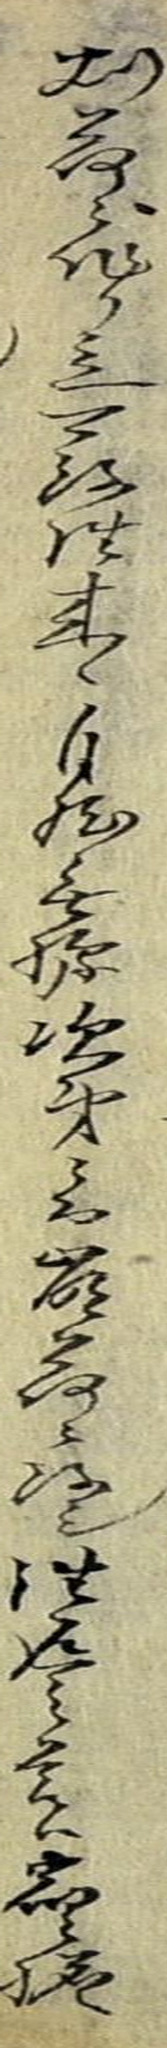判荷に作り立可致往来候自然無拠次第に而崩荷に致し往返之節は宿々担
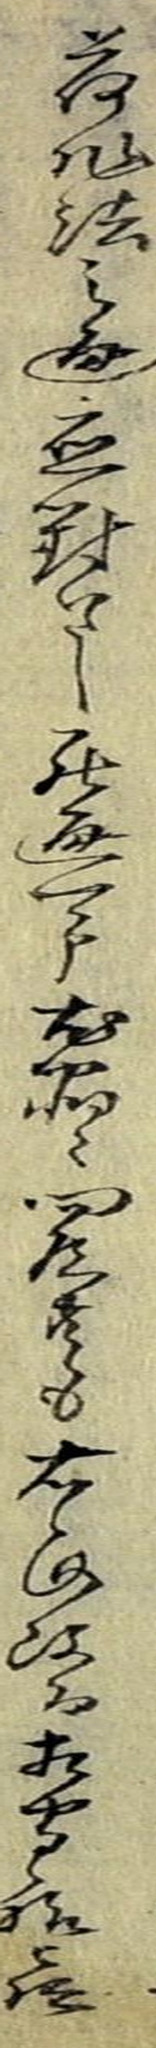荷作法之通応対いたし罷通可申尤宿々問屋共へも右之趣改而相守候様被指
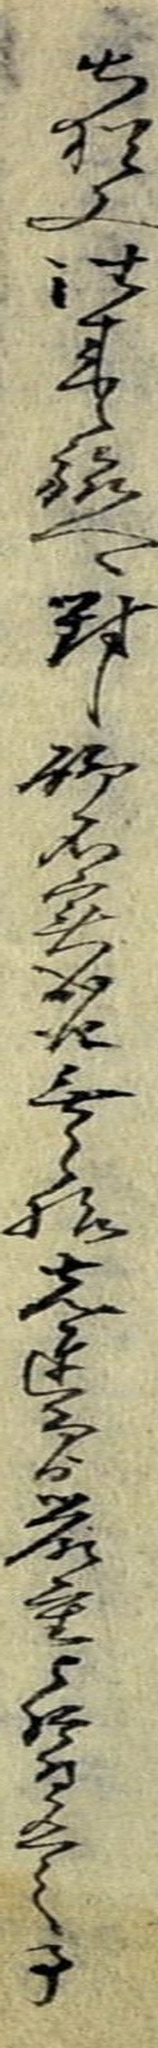出猶又往来旅人へ対し聊不実成儀無之様先達而ゟ厳重被仰付置候事
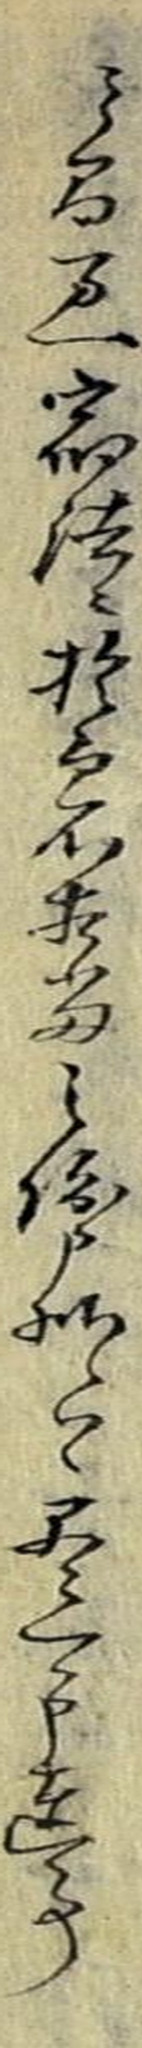に候間万一宿法に於而不相当之儀申掛候はヽ早々可申達事
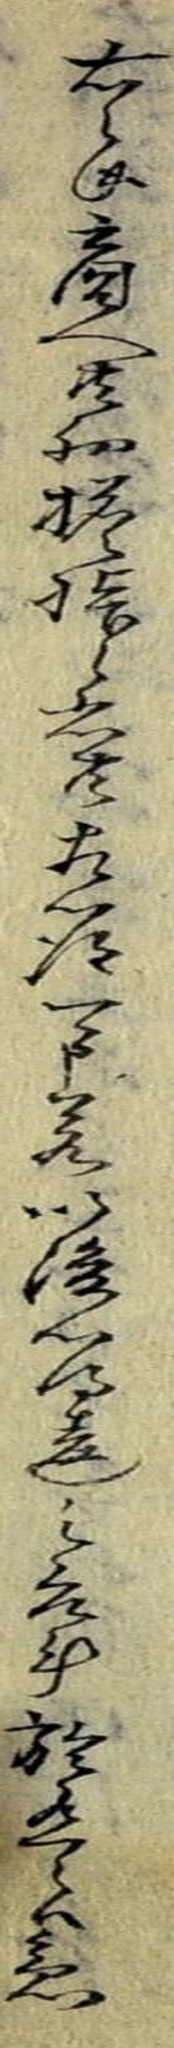右之趣商人共初担挊之者共相心得可申若以後心得違之取斗於有之は急
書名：命令之部 六
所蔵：福井県文書館 Fukui Prefectural Archives
